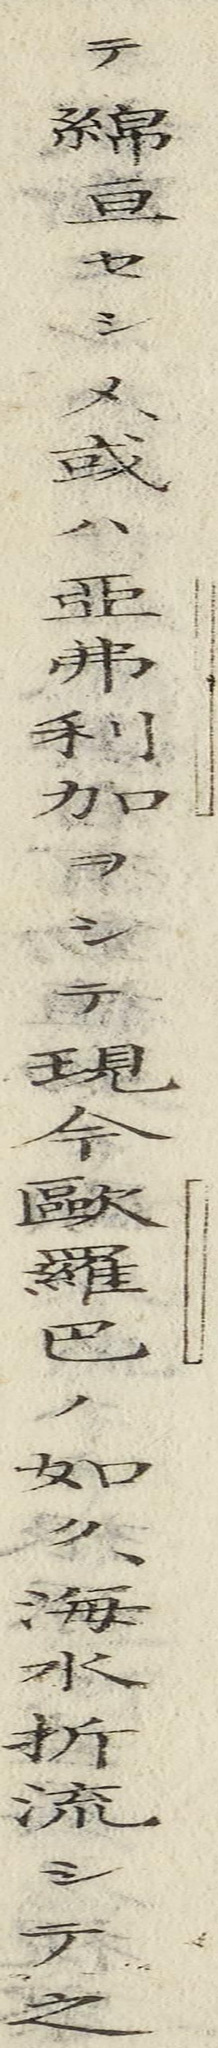テ綿亘セシメ、或ハ阿弗利加ヲシテ現今欧羅巴ノ如ク、海水折流シテ之

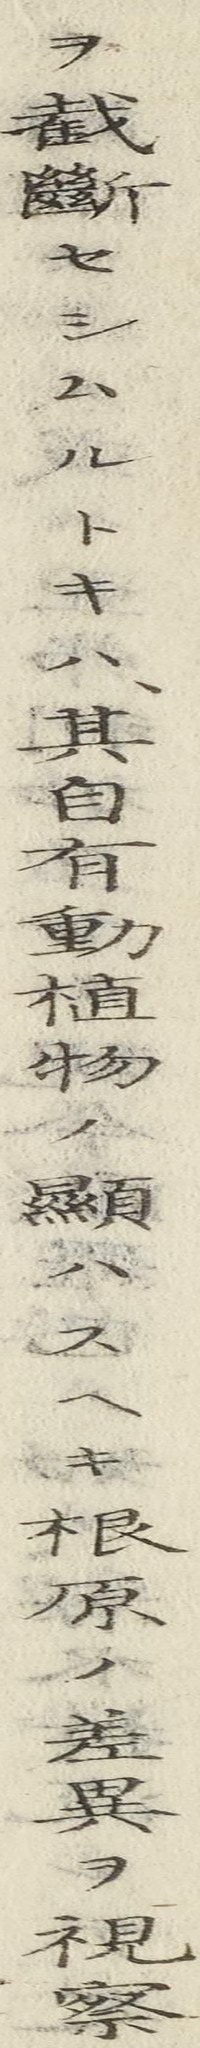ヲ截断セシムルトキハ、其自有動植物ノ顕ハスヘキ根原ノ差異ヲ視察
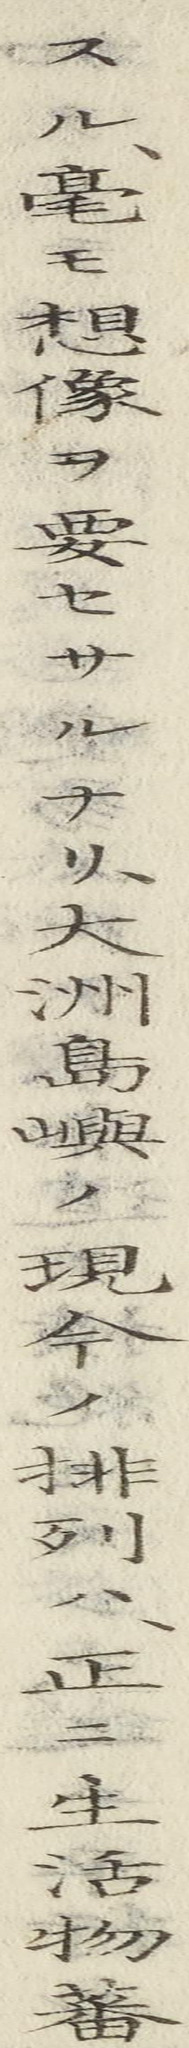スル、毫モ想像ヲ要セサルナリ、大洲島嶼ノ現今ノ排列ハ、正ニ生活物蕃
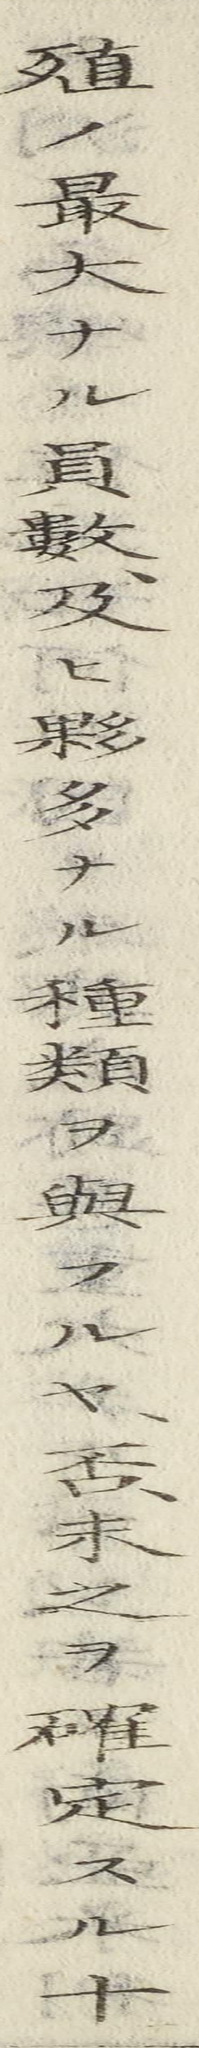殖ノ最大ナル員数、及ヒ夥多ナル種類ヲ与フルヤ、否、未之ヲ確定スル十
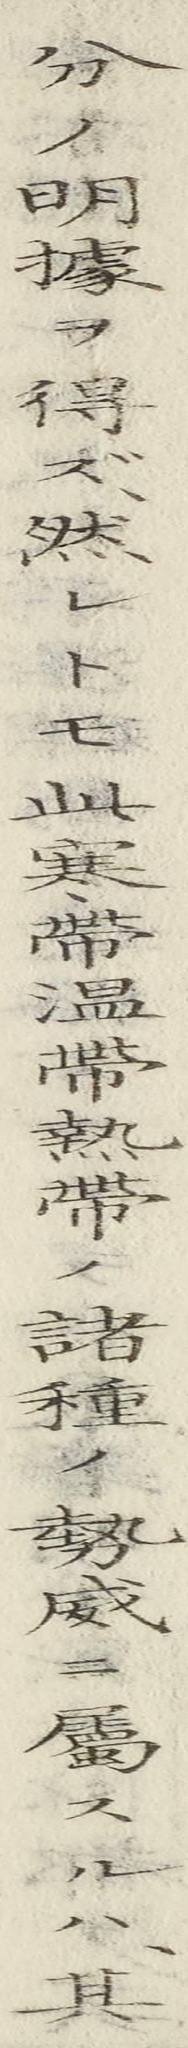分ノ明拠ヲ得ズ、然レトモ此寒帯温帯熱帯ノ諸種ノ勢威ニ属スルハ、其
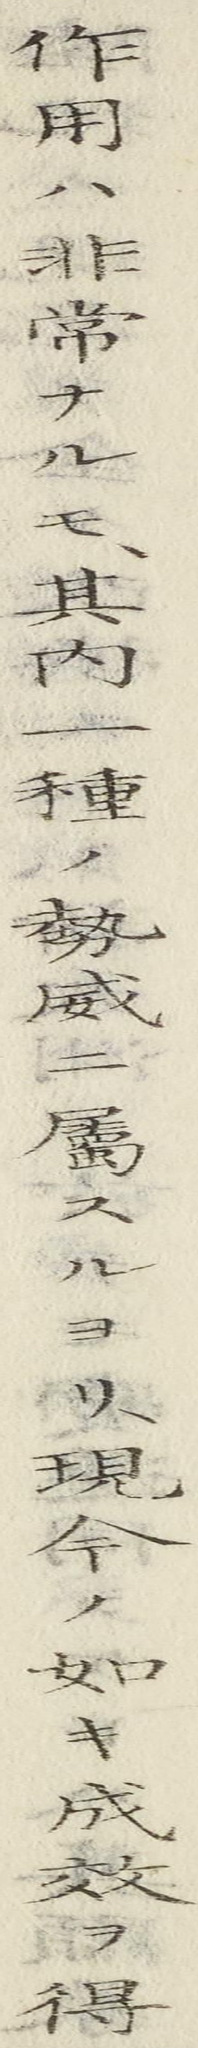作用ハ非常ナルモ、其内一種ノ勢威ニ属スルヨリ、現今ノ如キ成效ヲ得
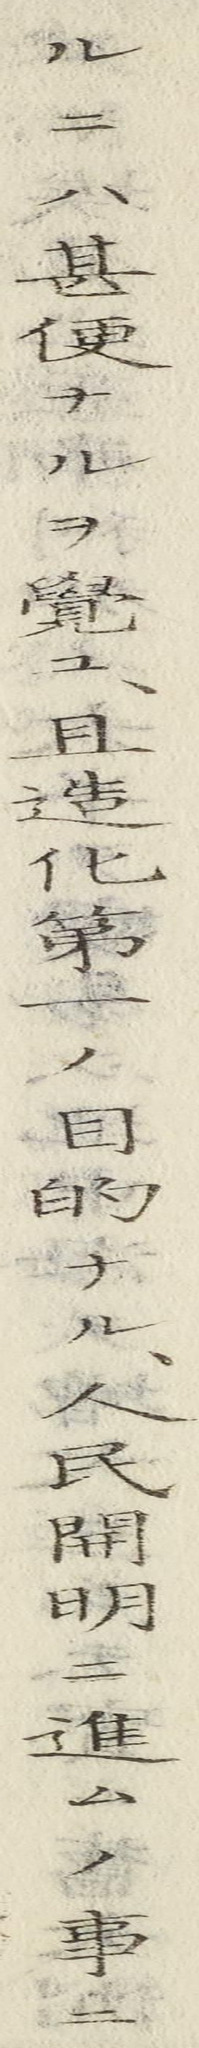ルニハ甚便ナルヲ覚ユ、且造化第一ノ目的ナル、人民開明ニ進ムノ事ニ
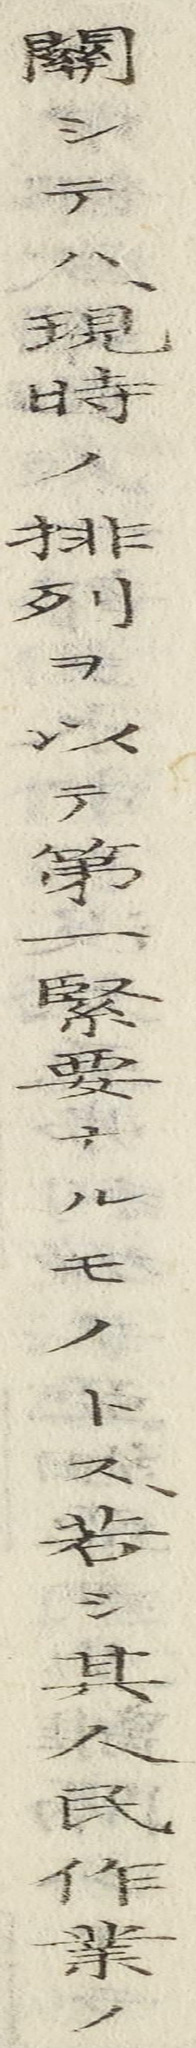関シテハ、現時ノ排列ヲ以テ第一緊要ナルモノトス、若シ其人民作業ノ
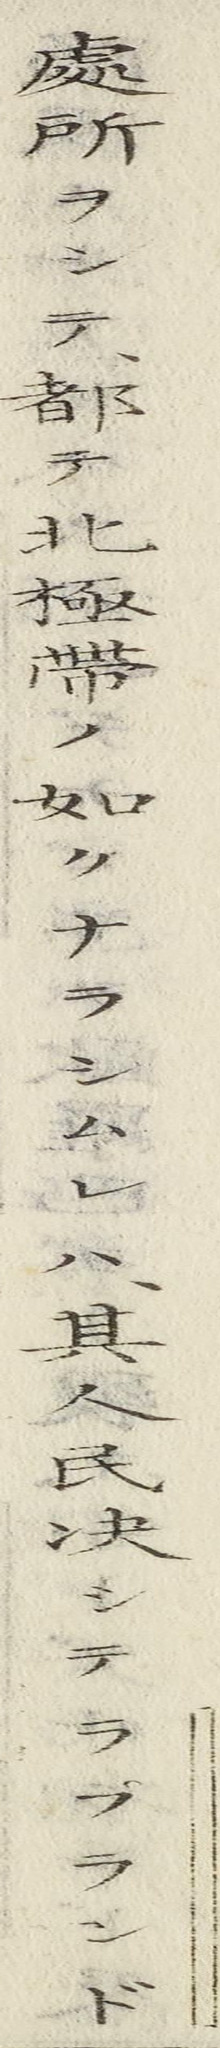処所ヲシテ、都テ北極帯ノ如クナラシムレハ、其人民決シテラフランド
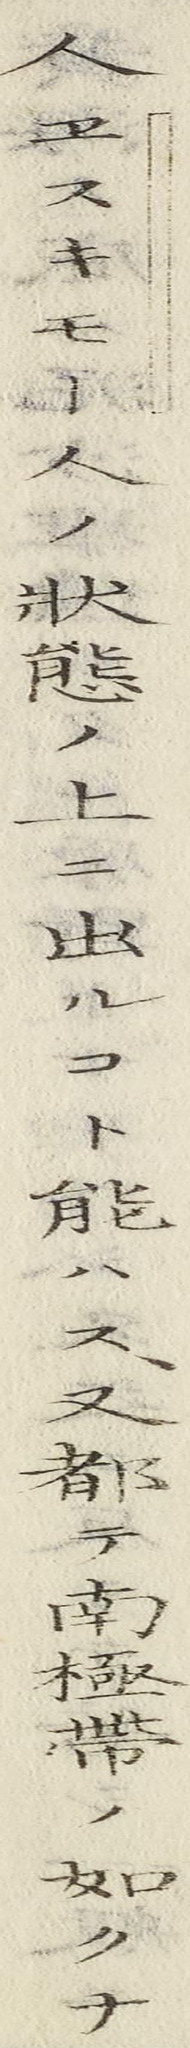人エスキモー人ノ状態ノ上ニ出ルコト能ハス、又都テ南極帯ノ如クナ
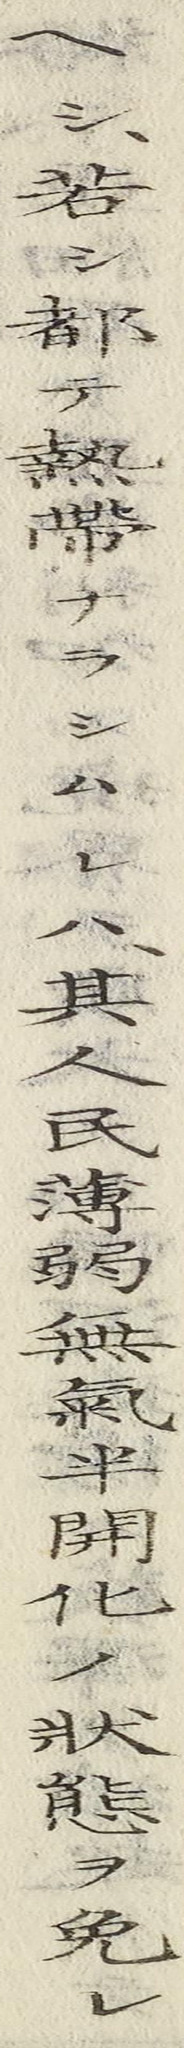ヘシ、若シ都テ熱帯ナラシムレハ、其人民薄弱無気半開化ノ状態ヲ免レ
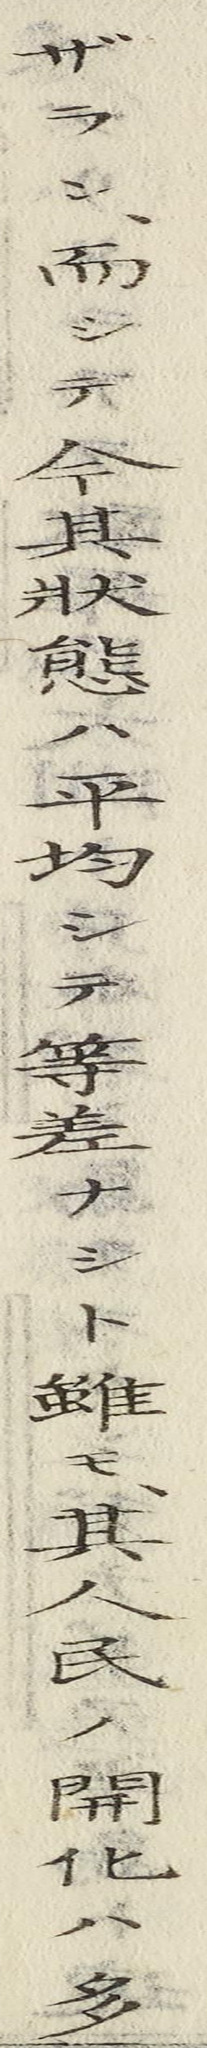ザラン、而シテ今其状態ハ平均シテ等差ナシト雖モ、其人民ノ開化ハ多
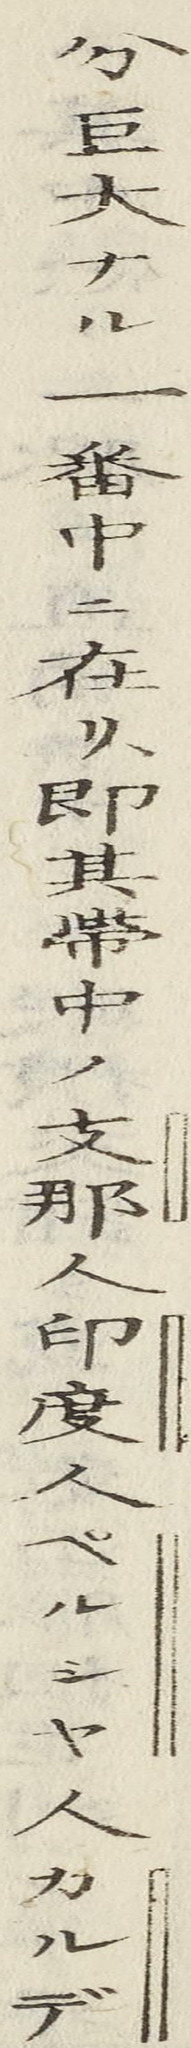分巨大ナル一番中ニ在リ、即其帯中ノ支那人印度人ペルシヤ人カルデ
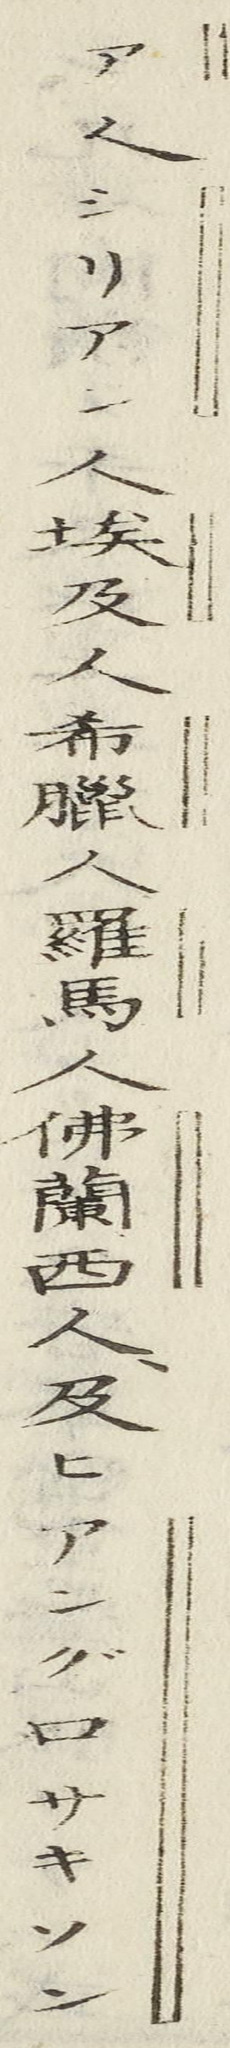ア人シリアン人埃及人希臘人羅馬人仏蘭西人、及ヒアングロサキソン
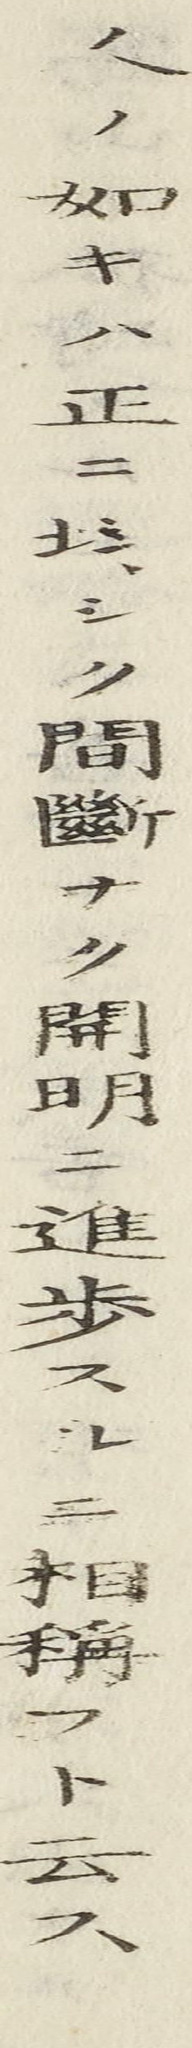人ノ如キハ正ニ均シク間断ナク開明ニ進歩スルニ相称フト云フ、
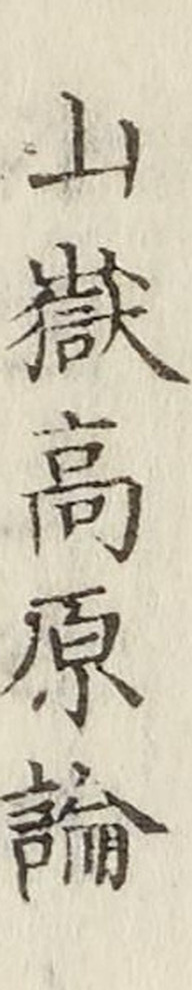山嶽高原論
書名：百科全書　地文學　全
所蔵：東京大学地震研究所図書室 Earthquake Research Institute Library, The University of Tokyo, JAPAN
